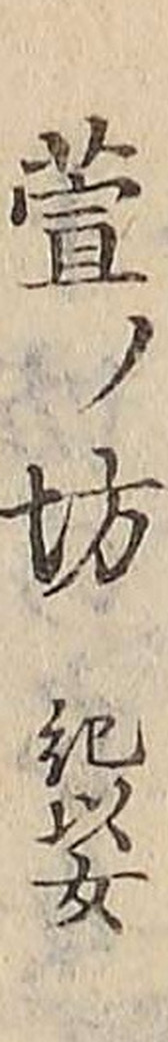萱ノ坊紀以女
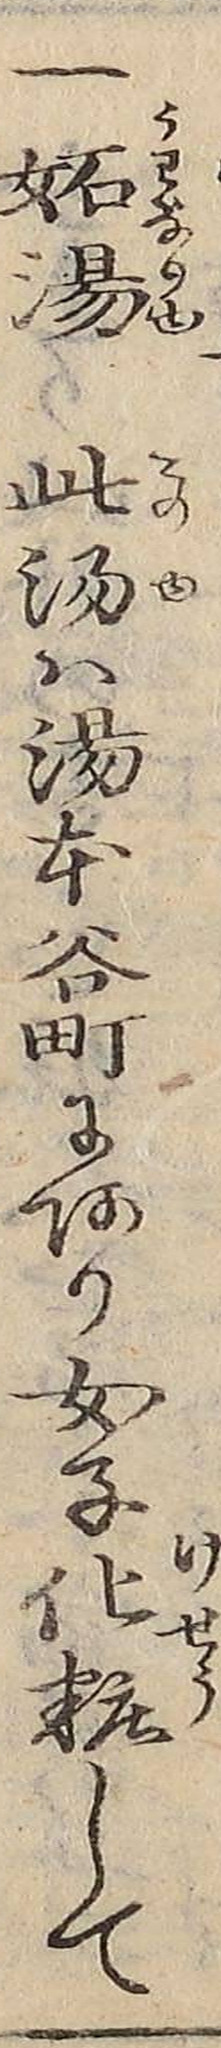一妬湯此湯は湯本谷町にあり女子化粧して
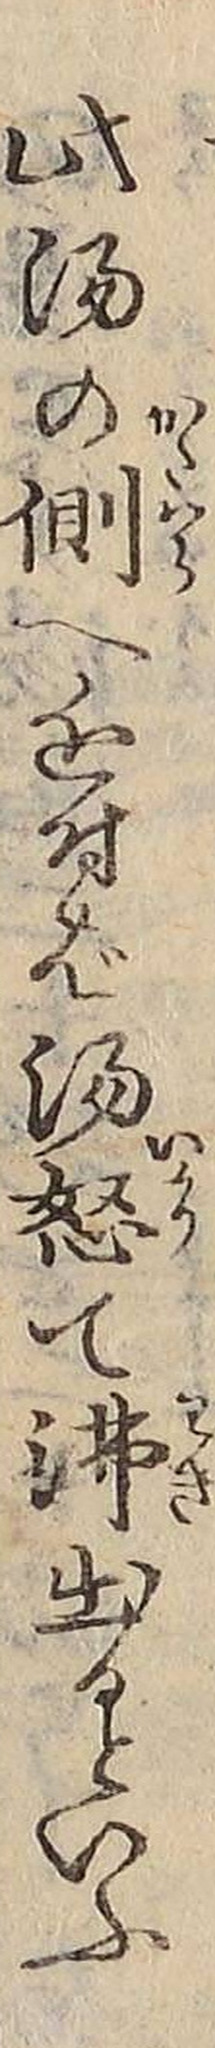此湯の側へ近付ば湯怒て沸出るといふ
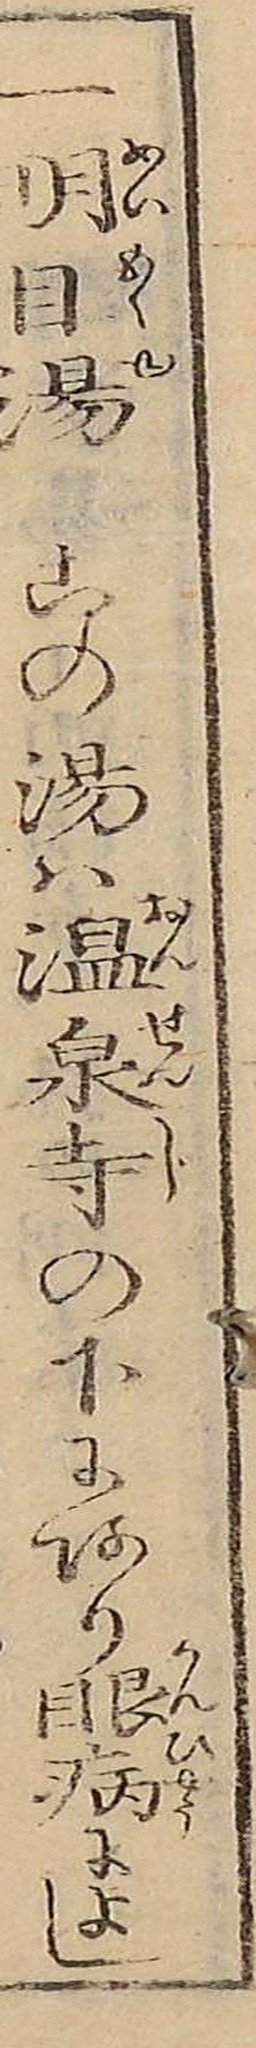一明目湯この湯は温泉寺の下にあり眼病によし
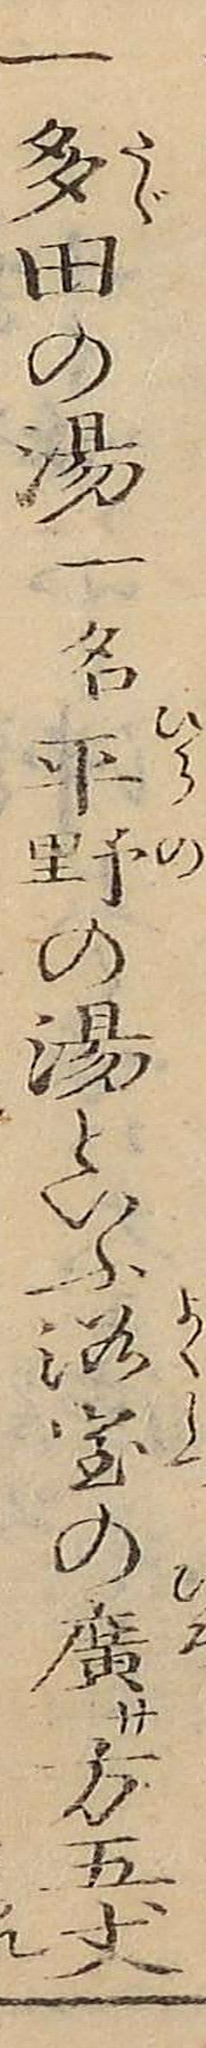一多田の湯一名平野の湯といふ浴室の広方五丈
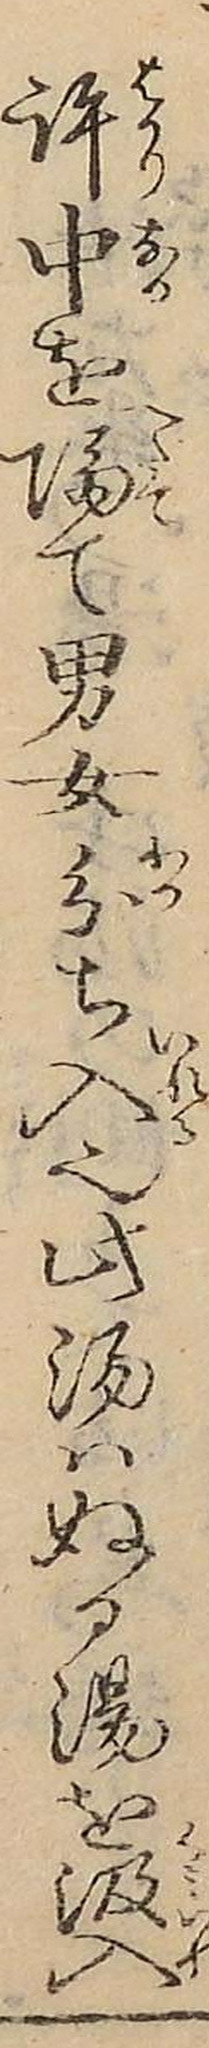計中を隔て男女分ち入也此湯はぬる湯を汲入
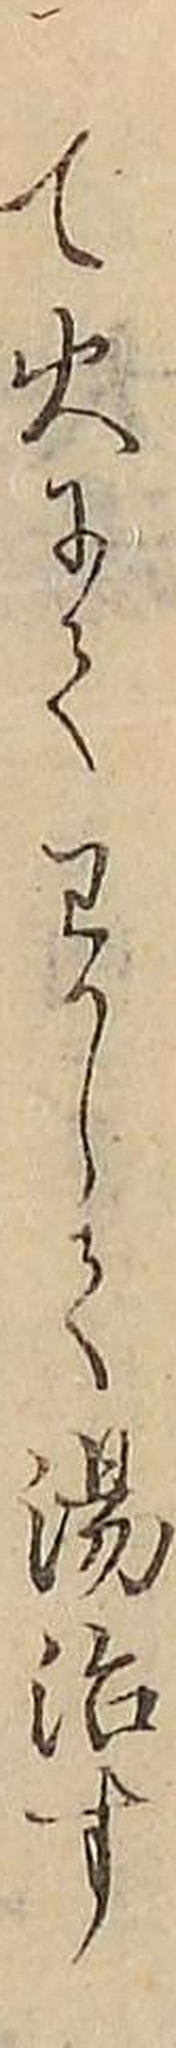て火にてわかして湯治す
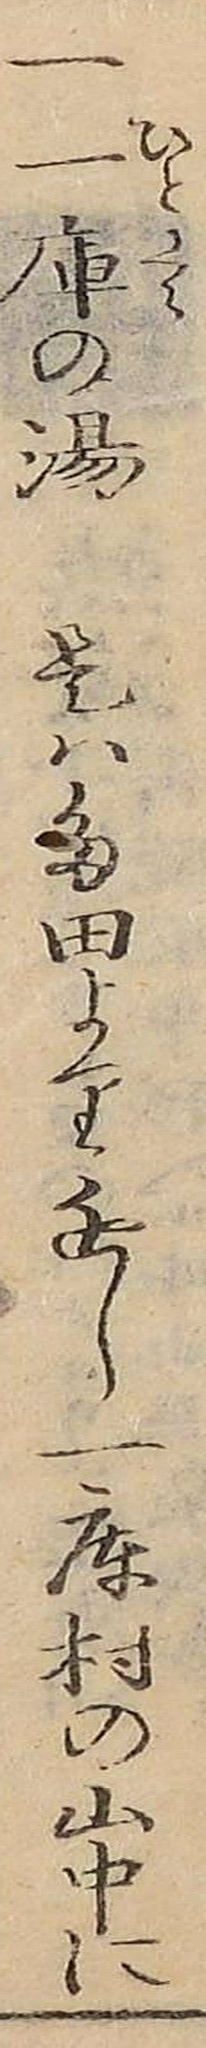一一庫の湯是は多田より近し一庫村の山中に
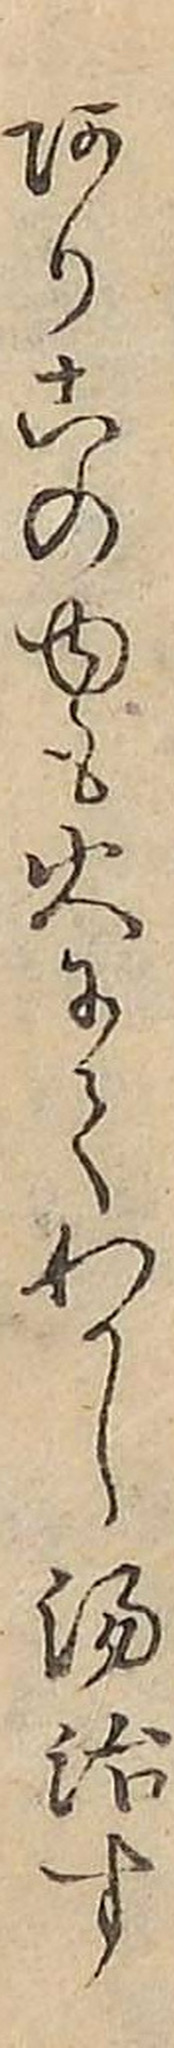ありこのゆも火にてわかし湯治す
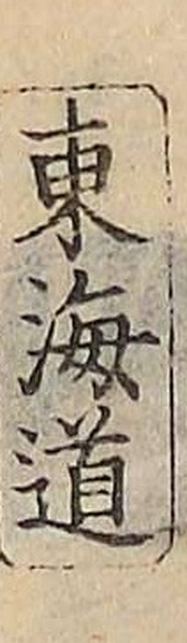東海道
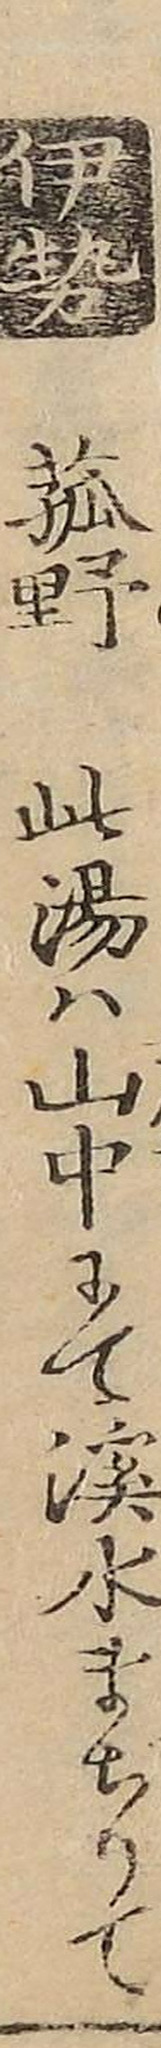伊勢菰野此湯は山中にて渓水まぢりて
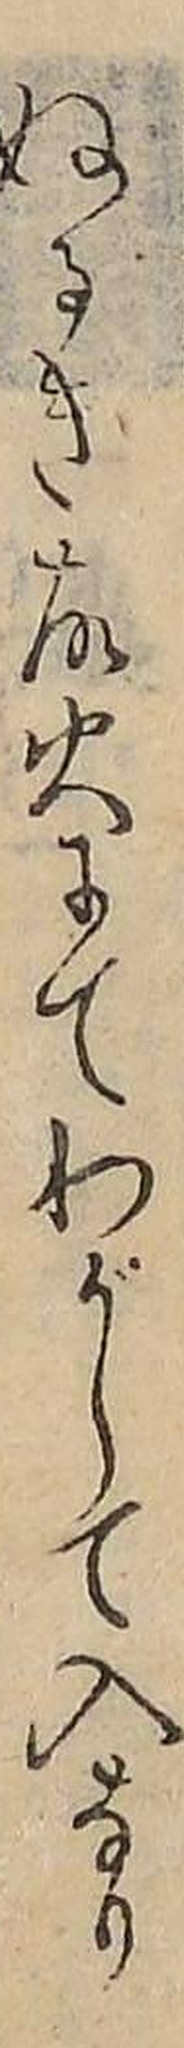ぬるき故火にてわがして入なり

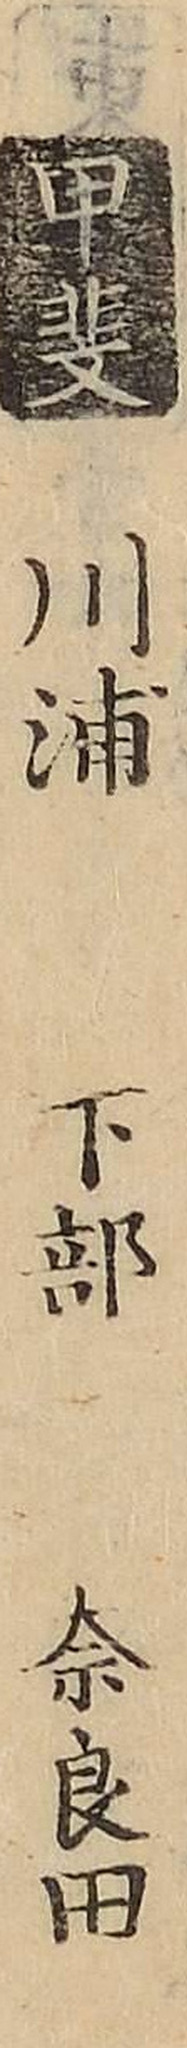甲斐川浦下部奈良田
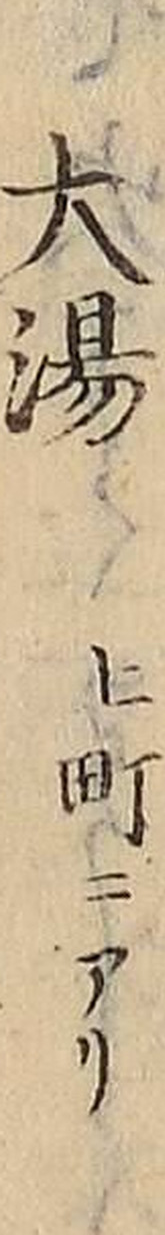大湯上町ニアリ
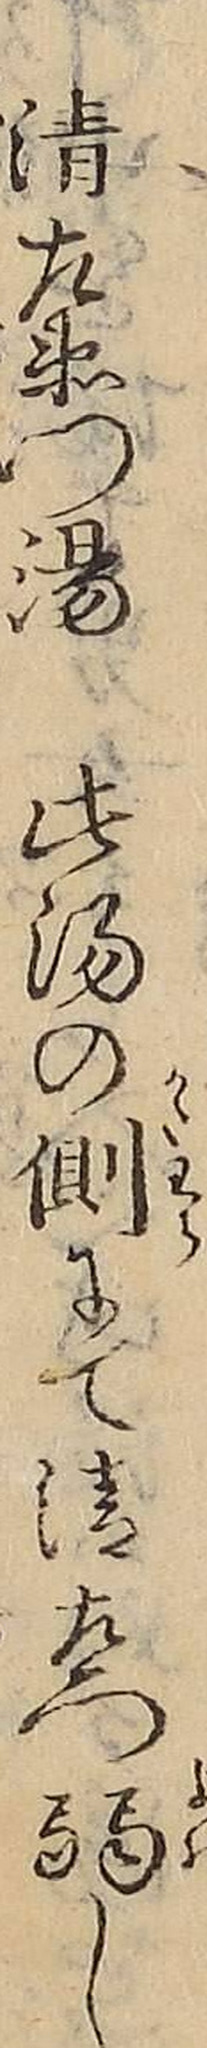清左衛門湯此湯の側にて清左衛門弱しと
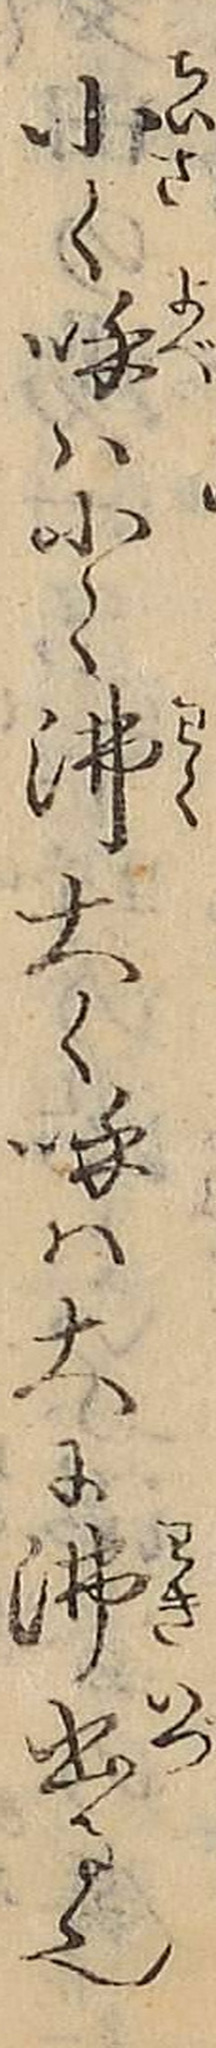小く呼は小く沸大く呼は大に沸出る也
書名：旅行用心集
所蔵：神戸大学附属図書館 国文学研究資料館
